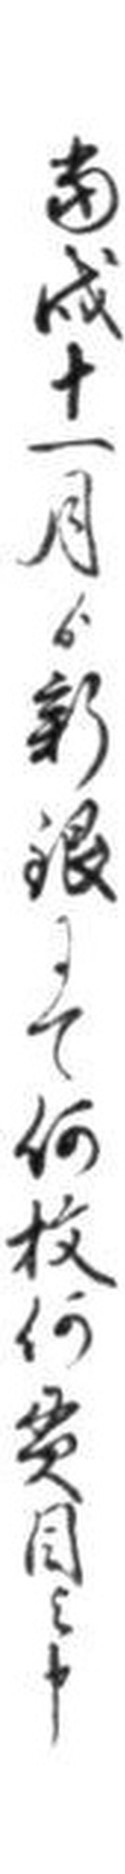当戌十一月ゟ新銀にて何枚何貫目与申
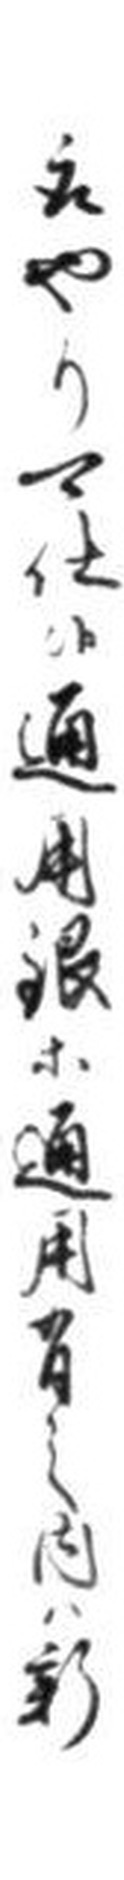取やり可仕候通用銀等通用有之内ハ新
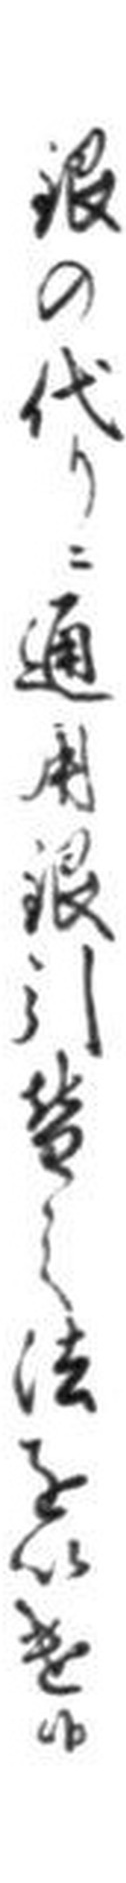銀の代りニ通用銀引替之法を以遣候
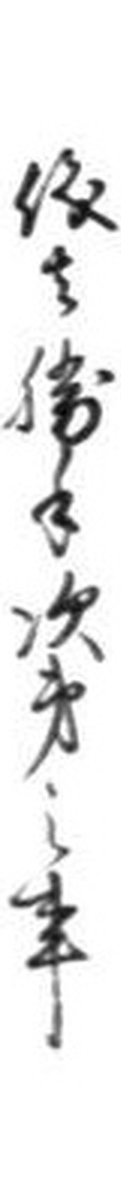儀者勝手次第之事
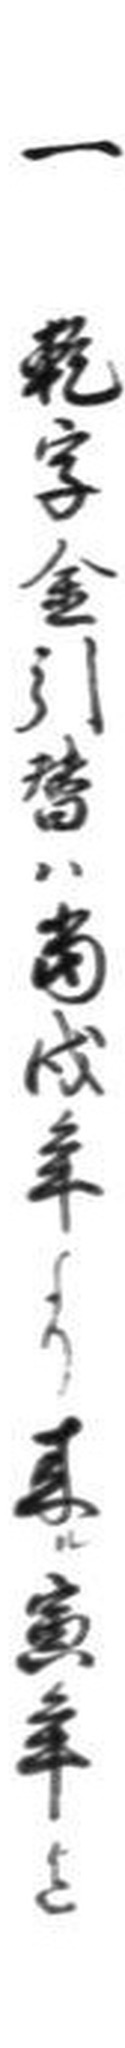一乾字金引替ハ当戌年より来ル寅年迄
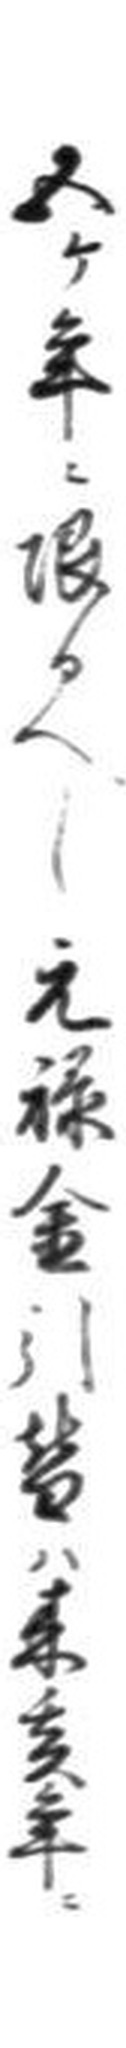五ケ年ニ限るへし元禄金引替ハ来亥年ニ
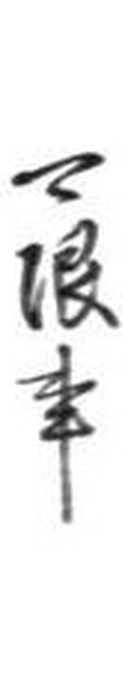可限事
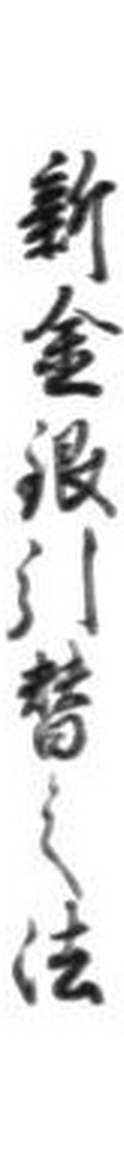新金銀引替之法
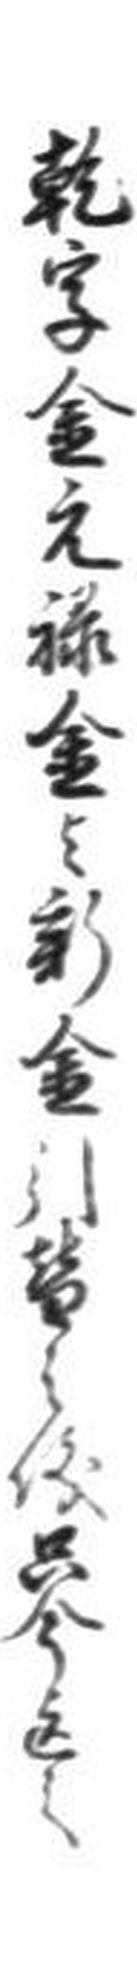乾字金元禄金与新金引替之儀只今迄之
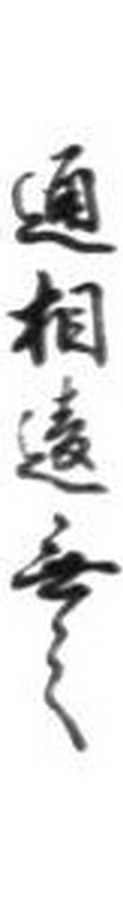通相違無之
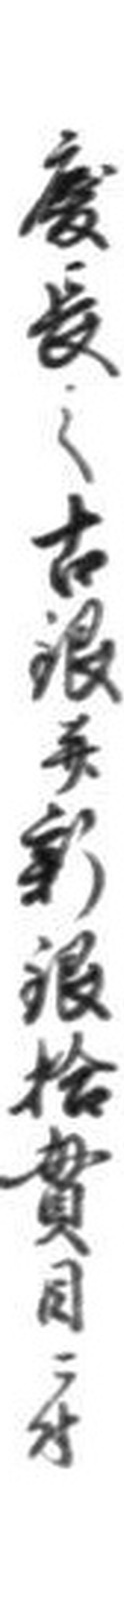慶長之古銀并新銀拾貫目ニ付
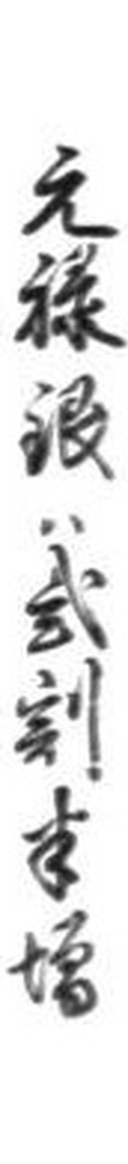元禄銀ハ弐割半増

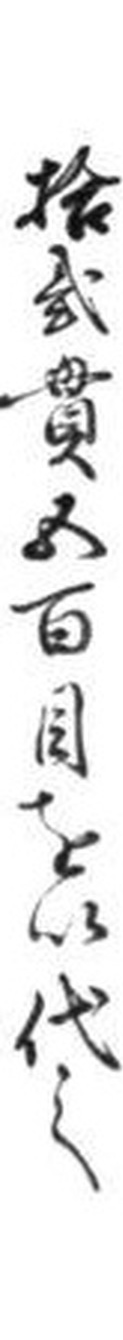拾弐貫五百目を以代之
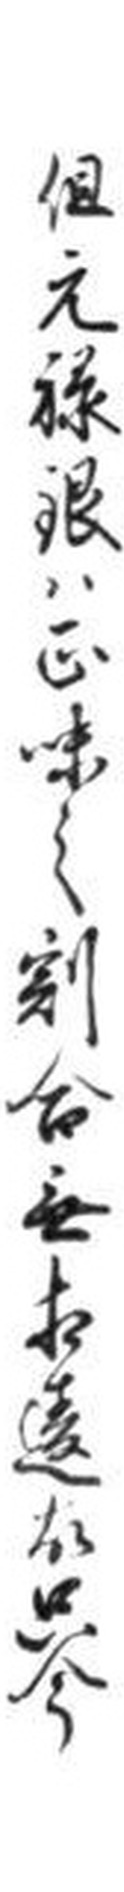但元禄銀ハ正味之割合無相違故只今
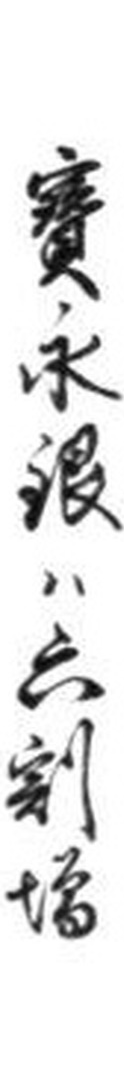宝永銀ハ六割増
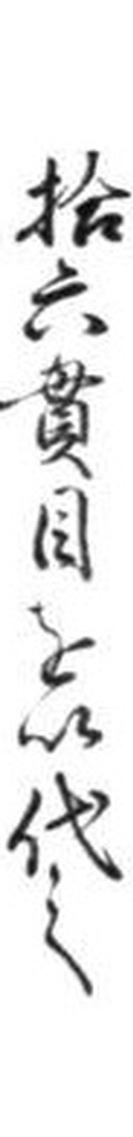拾六貫目を以代之
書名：家譜 三十二 吉邦公 従享保二年到享保三年
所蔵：福井県文書館 Fukui Prefectural Archives
